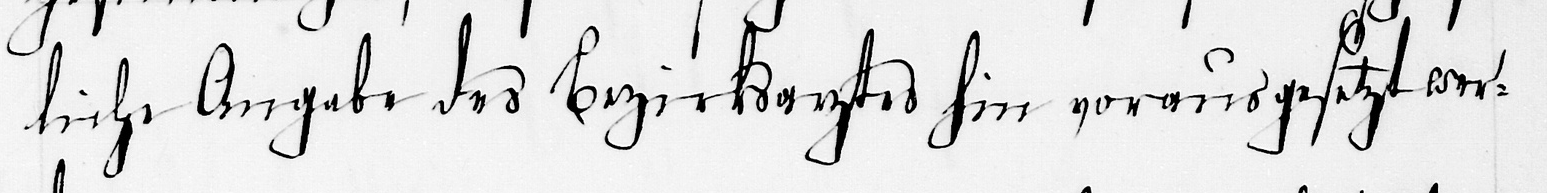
liche Angabe des Bezirksarztes hin vorausgesetzt wer¬
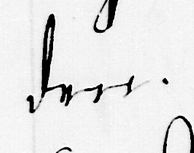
den.
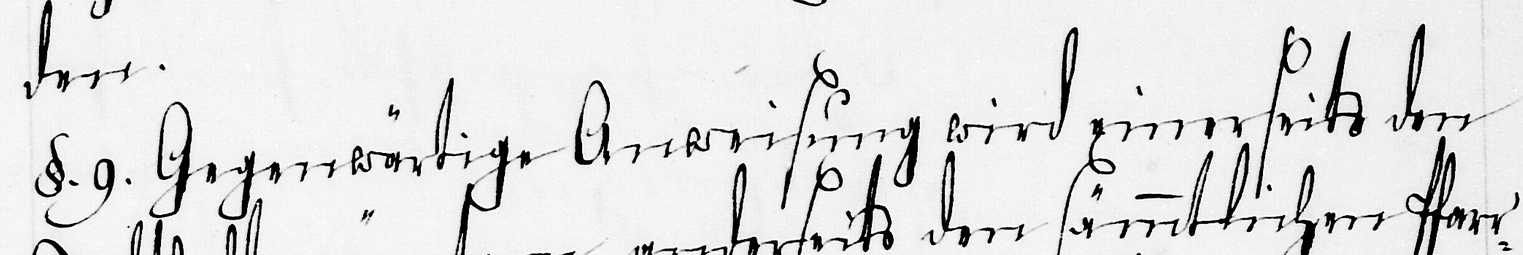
§. 9. Gegenwärtige Anweisung wird einerseits den
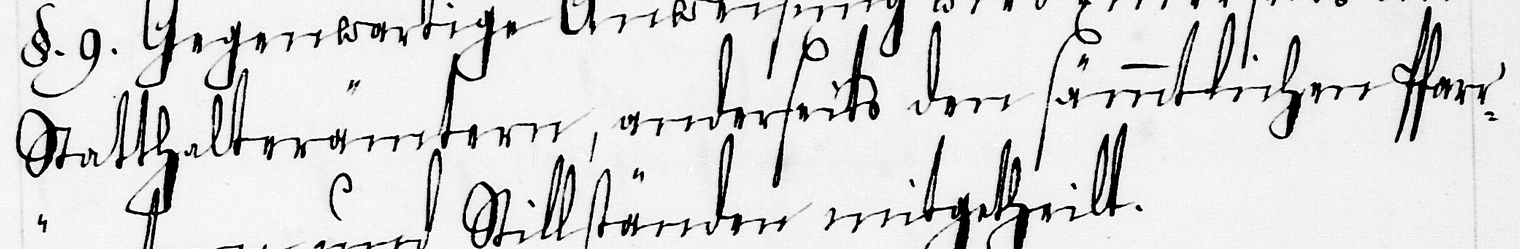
Statthalterämtern, anderseits den sämmtlichen Pfar¬
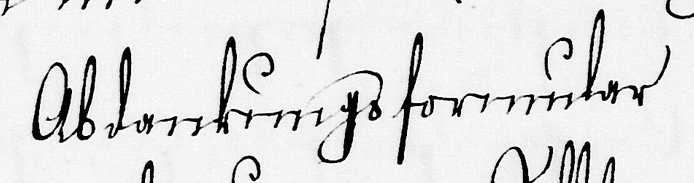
Abdankungsformular
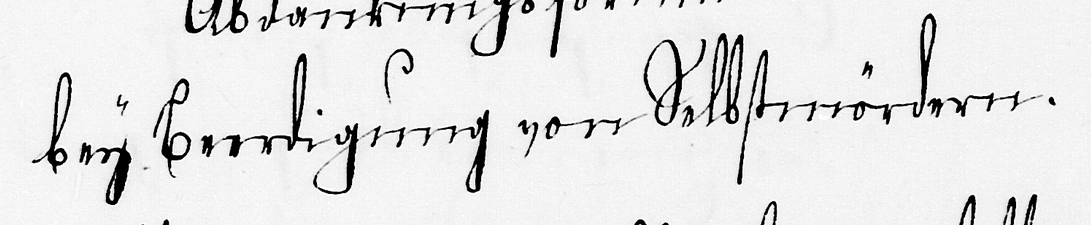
bey Beerdigung von Selbstmördern.
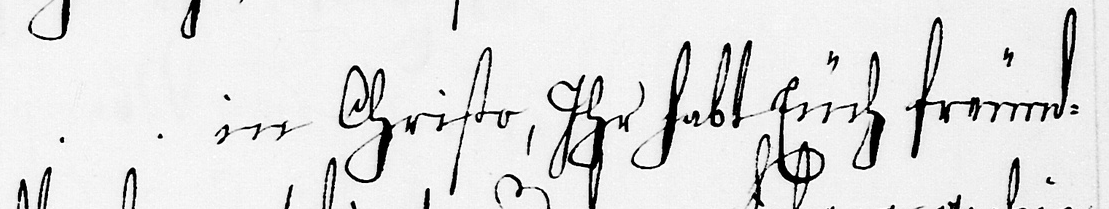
… in Christo, Ihr habt Euch freund¬
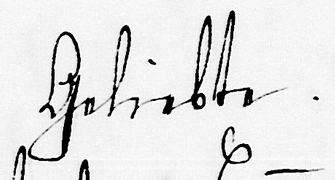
Geliebte
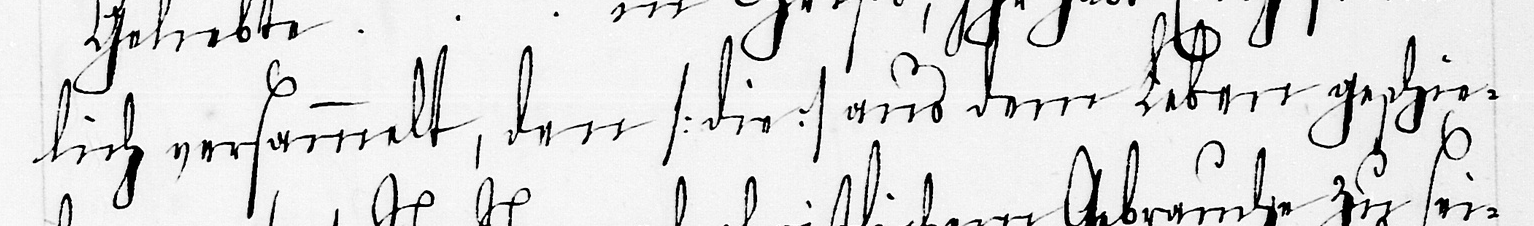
lich versammelt, den [die] aus dem Leben geschie¬
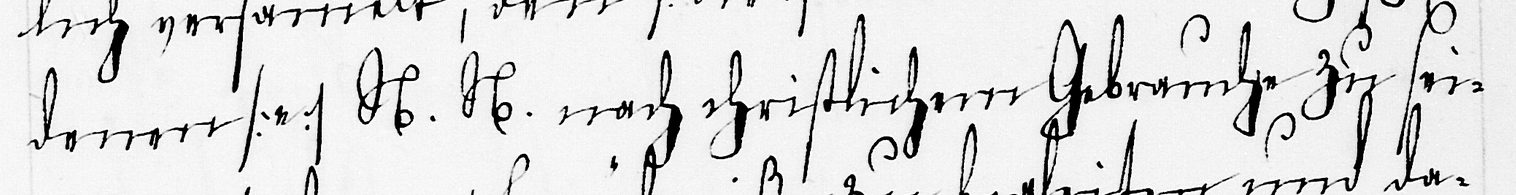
denen[e] N. N. nach christlichem Gebrauche zu sei¬
